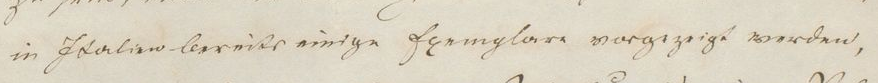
in Italien bereits einige Exemplare vorgezeigt werden,
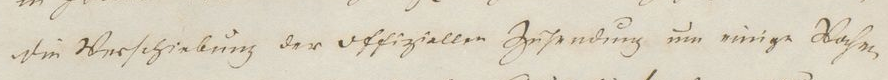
die Verschiebung der offiziellen Zusendung um einige Wochen
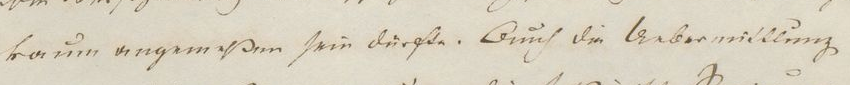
kaum angemeßen sein dürfte. Auch die Uebermittlung
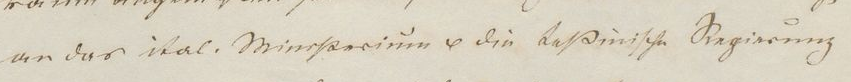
an das ital. Ministerium & die teßinische Regierung
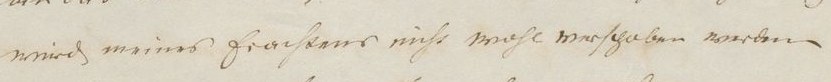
wird meines Erachtens nicht wohl verschoben werden
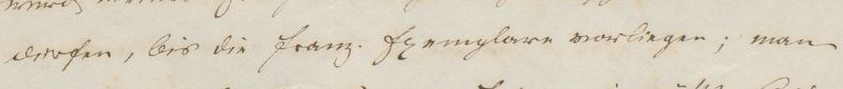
dürfen, bis die franz. Exemplare vorliegen; man
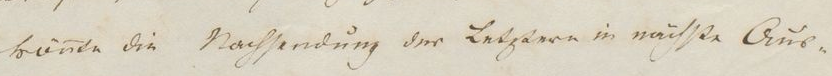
könnte die Nachsendung der Letztern in nächste Aus-
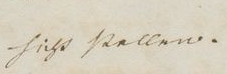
sicht stellen.
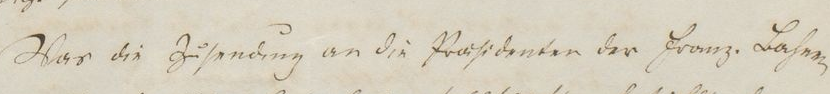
Was die Zusendung an die Präsidenten der franz. Bahnen
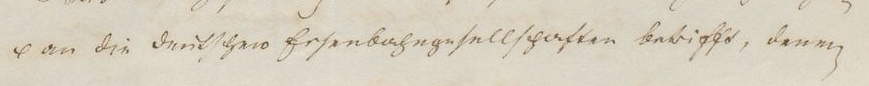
& an die deutschen Eisenbahngesellschaften betrifft, denen
